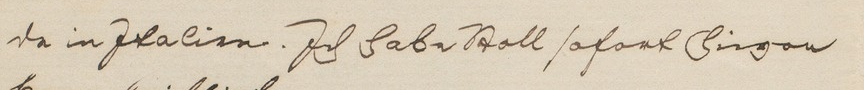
de in Italien. Ich habe Stoll sofort hievon
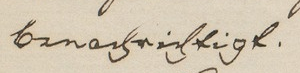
benachrichtigt
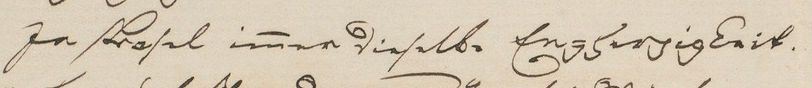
In Basel immer dieselbe Engherzigkeit.
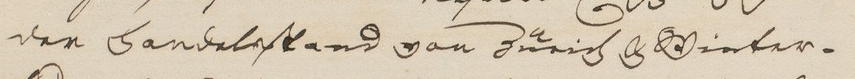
Der Handelsstand von Zürich & Winter-
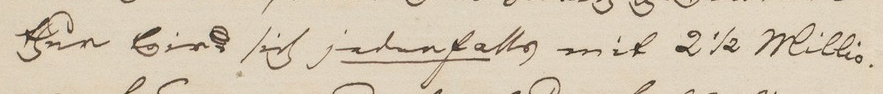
thur wird sich jedenfalls mit 2 ½ Millio-
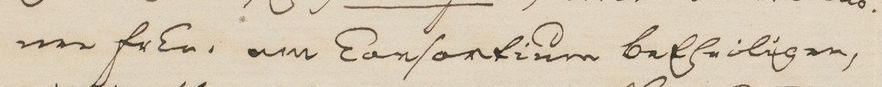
nen Frkn. am Consortium betheiligen,
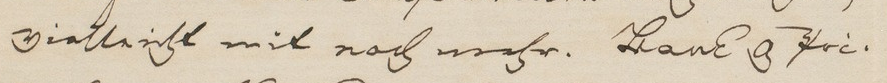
vielleicht mit noch mehr. Bank & Pri-
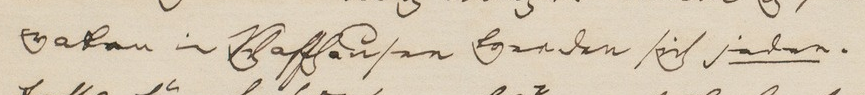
vaten in Schaffhausen werden sich jeden-
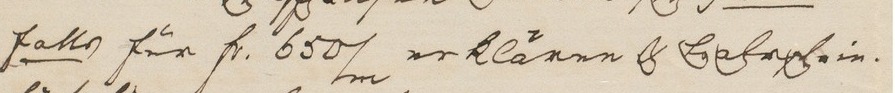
falls für Fr. 650/m erklären & wahrschein-
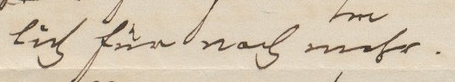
lich für noch mehr.
